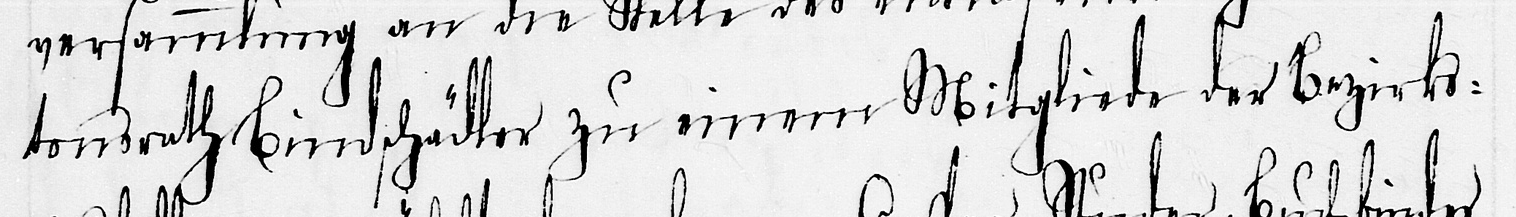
tonsrath Bindschädler zu einem Mitgliede der Bezirks¬
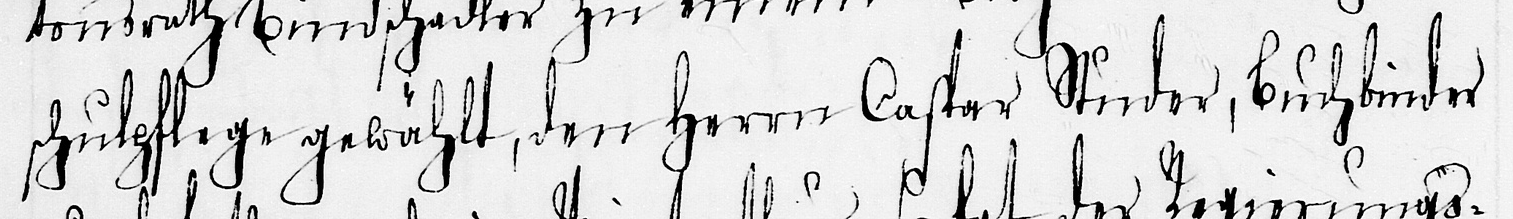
schulpflege gewählt, den Herrn Caspar Studer, Buchbinder
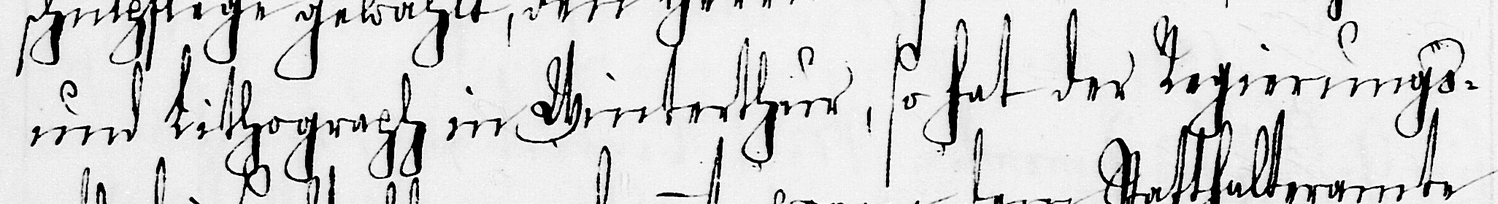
und Lithograph in Winterthur, so hat der Regierungs¬
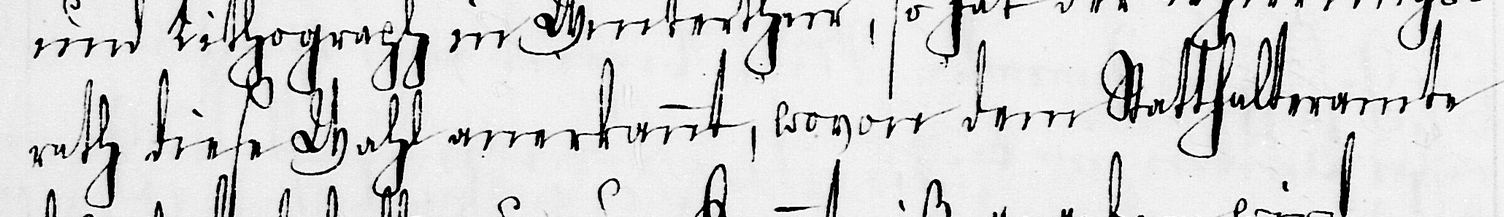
rath diese Wahl anerkannt, wovon dem Statthalteramte
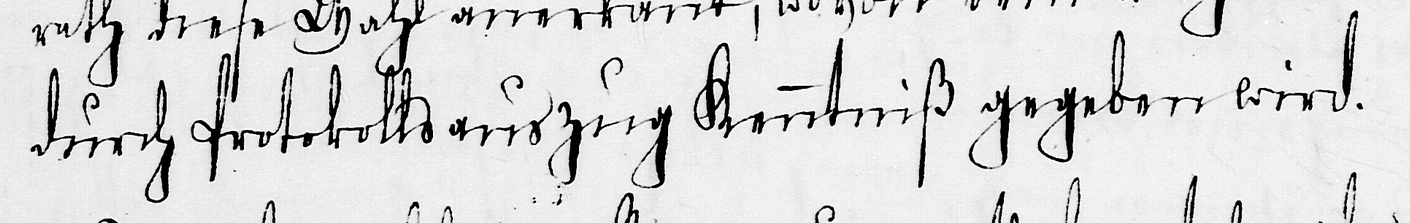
durch Protokollsauszug Kenntniß gegeben wird.
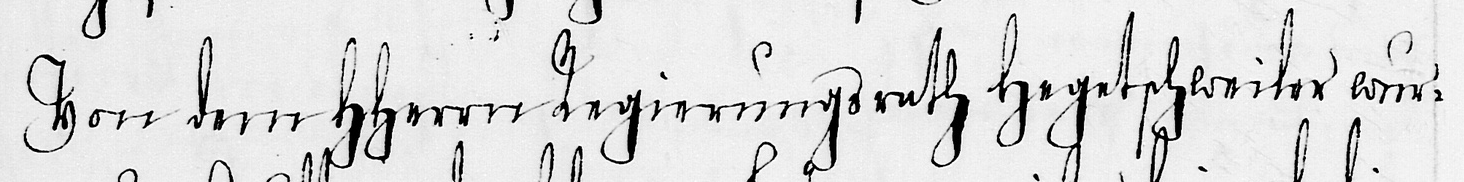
Von dem HHerrn Regierungsrath Hegetschweiler wur¬
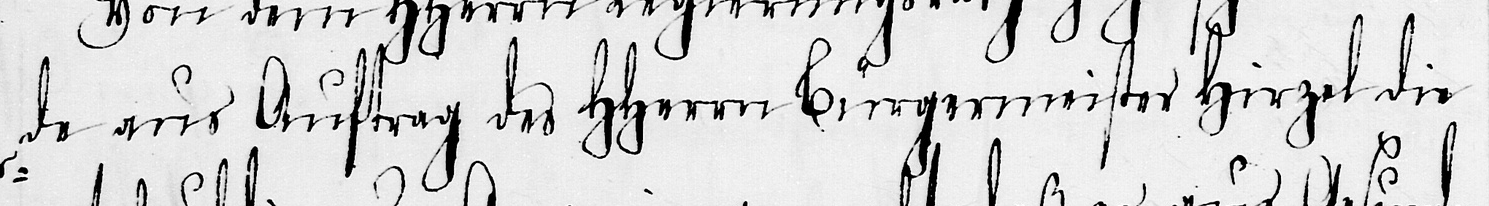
de aus Auftrag des HHerrn Bürgermeister Hirzel die
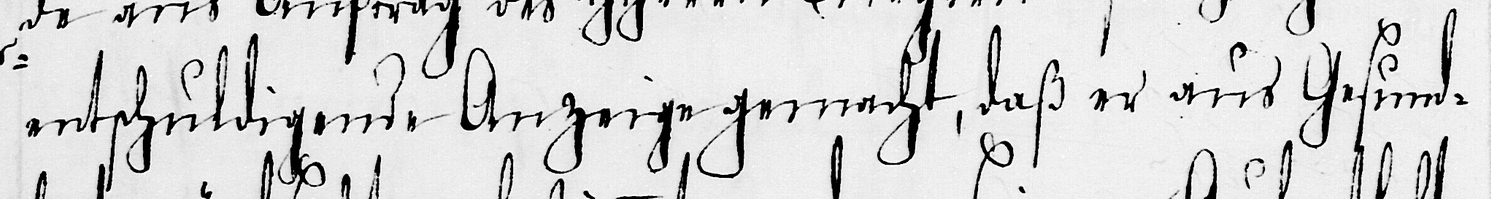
entschuldigende Anzeige gemacht, daß er aus Gesund¬
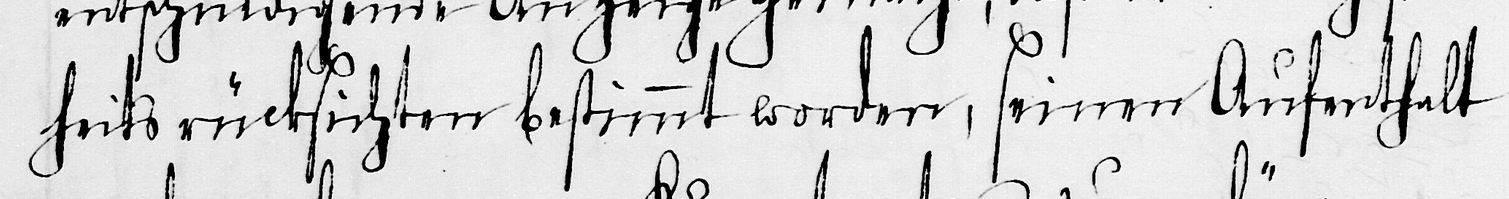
heitsrücksichten bestimmt worden, seinen Aufenthalt
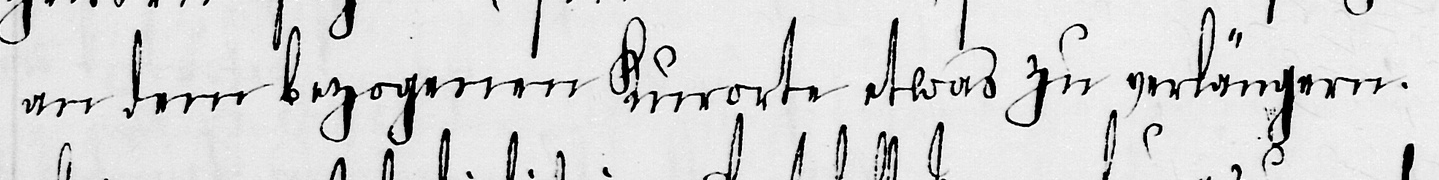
an dem bezogenen Kurorte etwas zu verlängern.
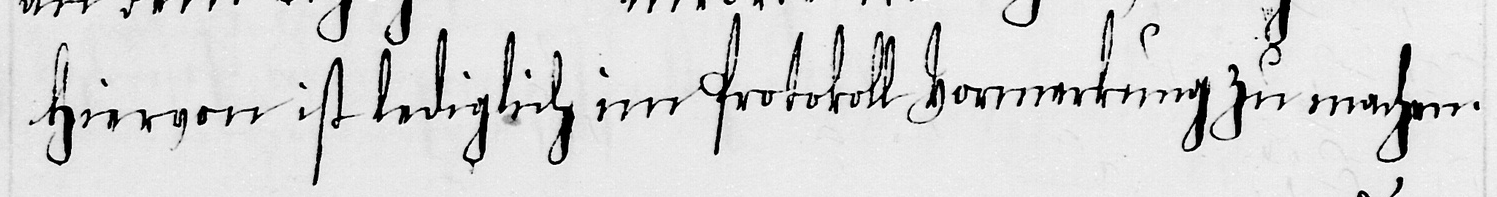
Hiervon ist lediglich im Protokoll Vormerkung zu machen.
